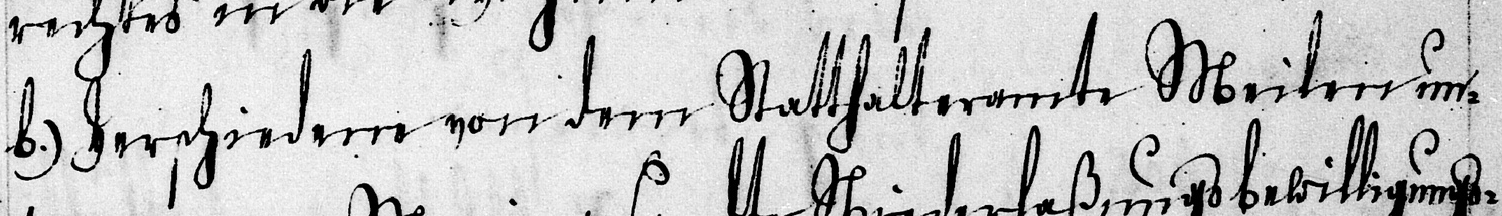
b.) Verschiedene von dem Statthalteramte Meilen un¬
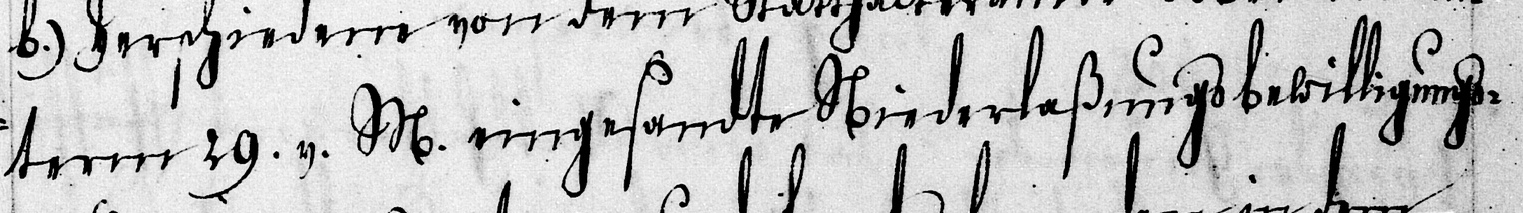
term 29. v. M. eingesandte Niederlaßungsbewilligungs¬
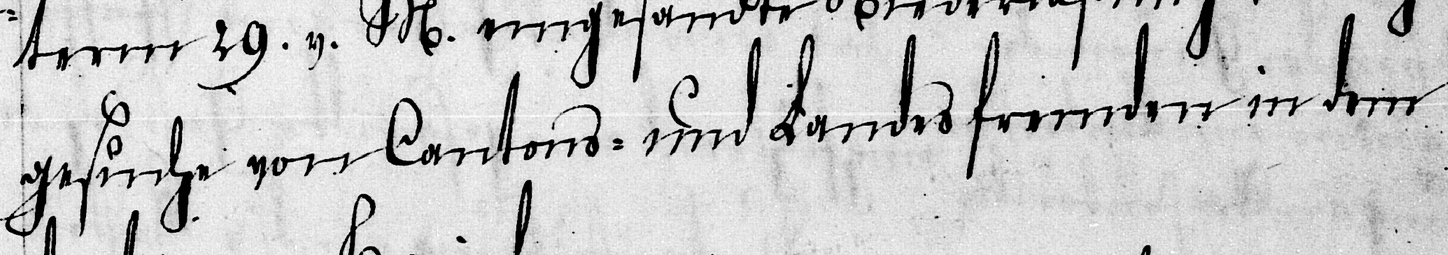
gesuche von Cantons- und Landesfremden in dem
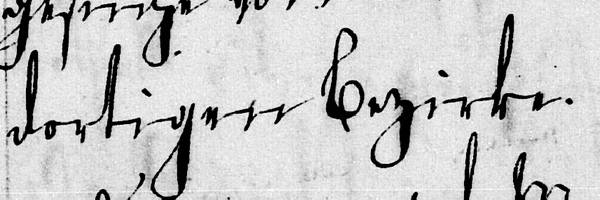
dortigen Bezirke.
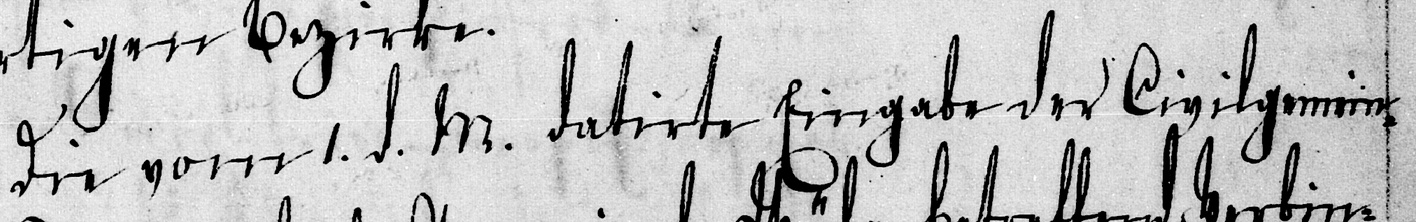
Die vom 1. d. M. datirte Eingabe der Civilgemein¬
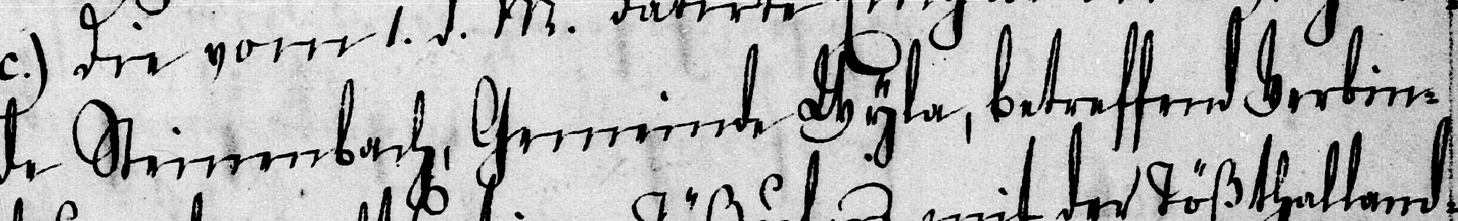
de Steinenbach, Gemeinde Wyla, betreffend Verbin¬
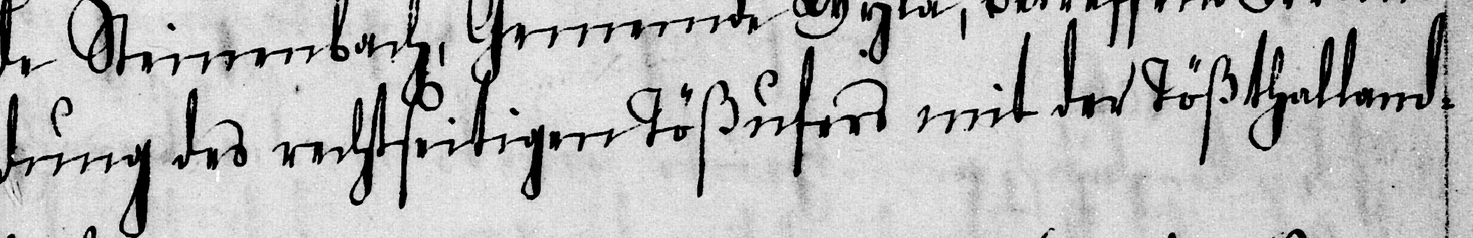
dung des rechtseitigen Tößufers mit der Tößthallands¬
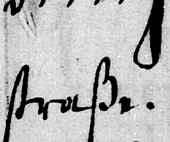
traße.
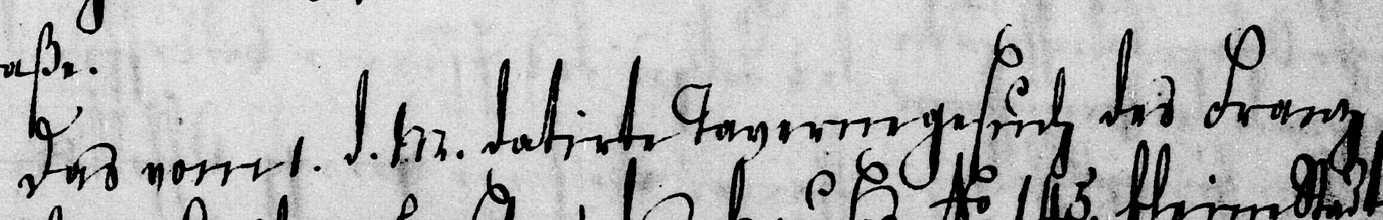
Das vom 1. d. M. datirte Tavernengesuch des Franz
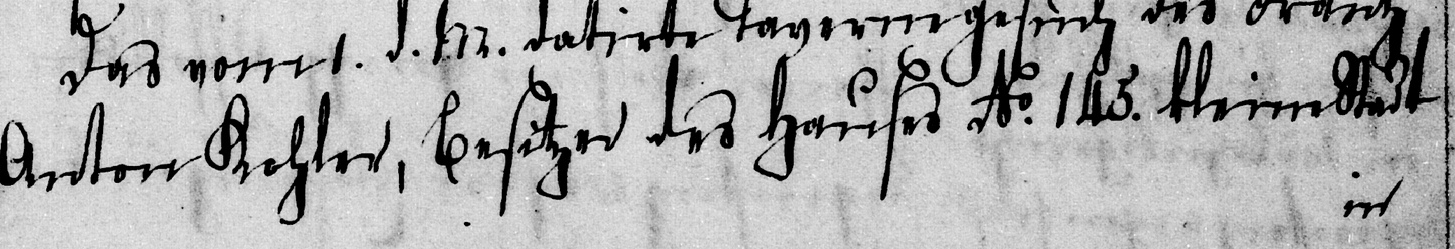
Anton Kohler, Besitzer des Hauses No. 145. kleine Stadt
